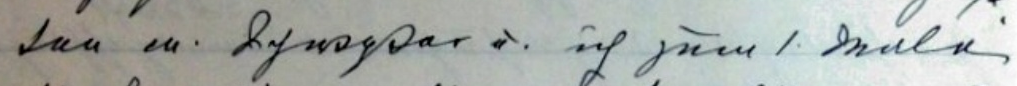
ten m. Schwester u. ich zum I. Male
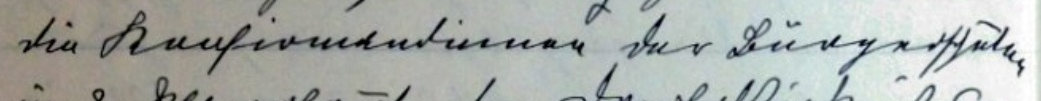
die Konfirmandinnen der Bürgerschulen
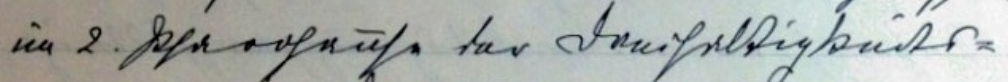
Bürgerschulen im 2. Pfarrhaus der Dreifaltigkeits-
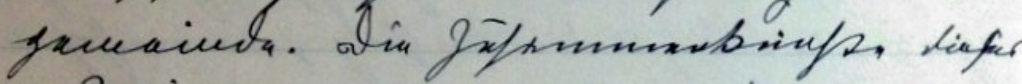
gemeinde. Die Zusammenkünfte dieses
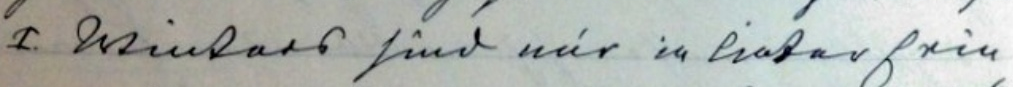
I. Winters sind mir in bester Erin
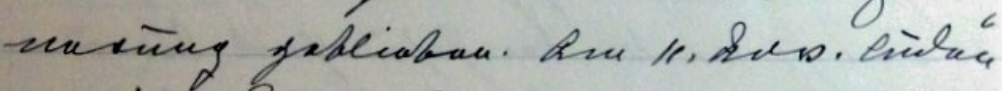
nerung geblieben. Am 11. Nov. luden
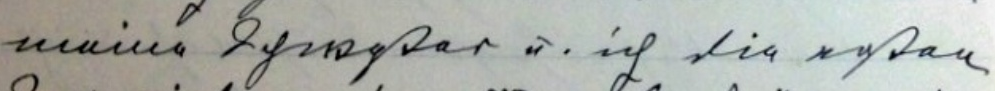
meine Schwester u. ich die ersten
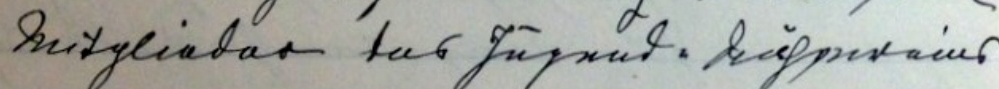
Mitglieder des Jugend-Nähvereins
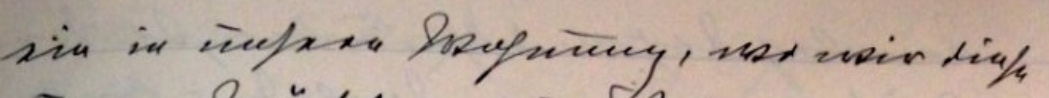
ein in unsere Wohnung, wo wir diese
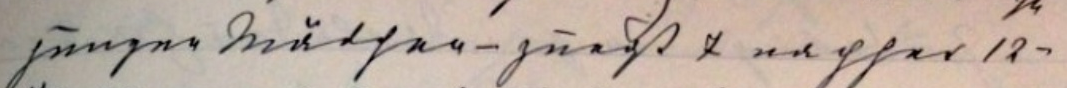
jungen Mädchen – zuerst 7 nachher 12 –
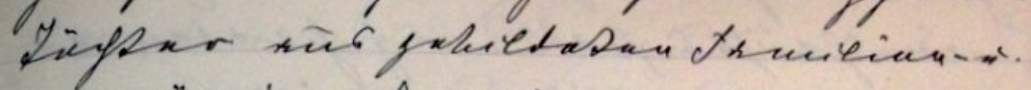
Töchter aus gebildeten Familien u.
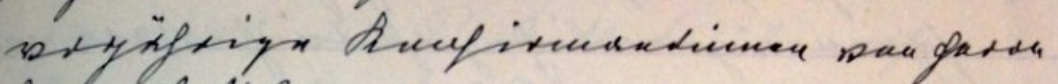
u. vorjährige Konfirmandinnen von Herrn
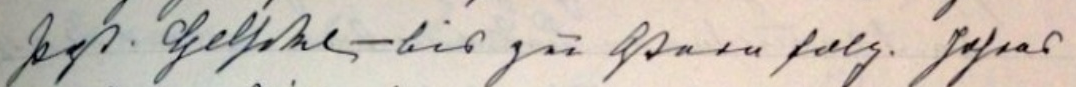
Pf. Gelsche - bis zu Ostern folg. Jahres
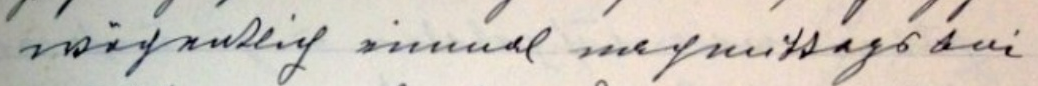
wöchentlich einmal nachmittags bei
